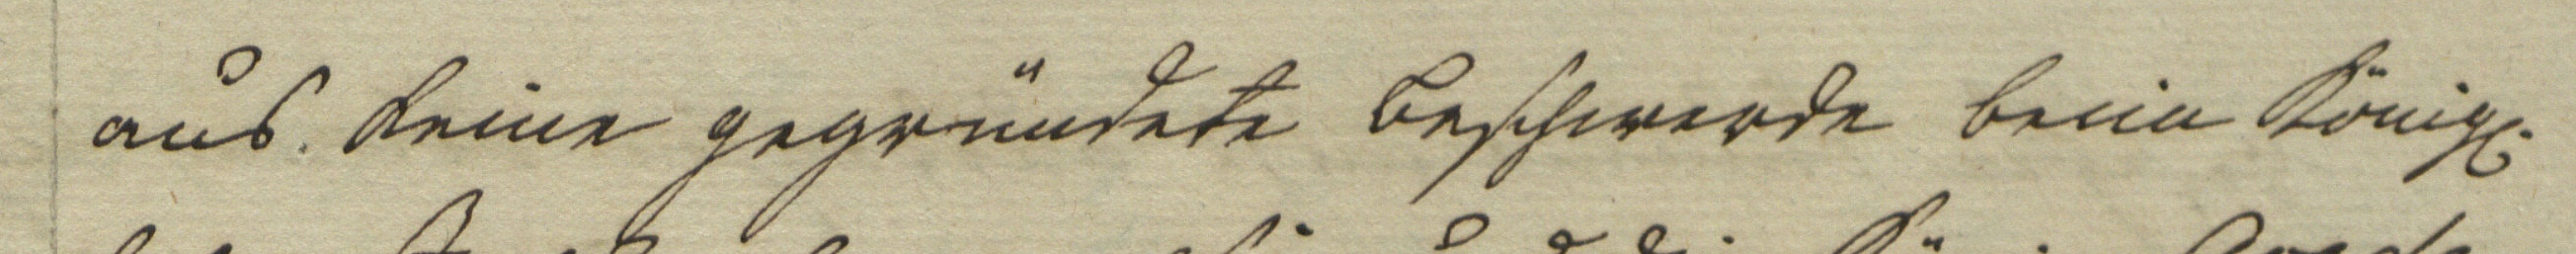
aus keine geguündete Beschwerde beim Königl.
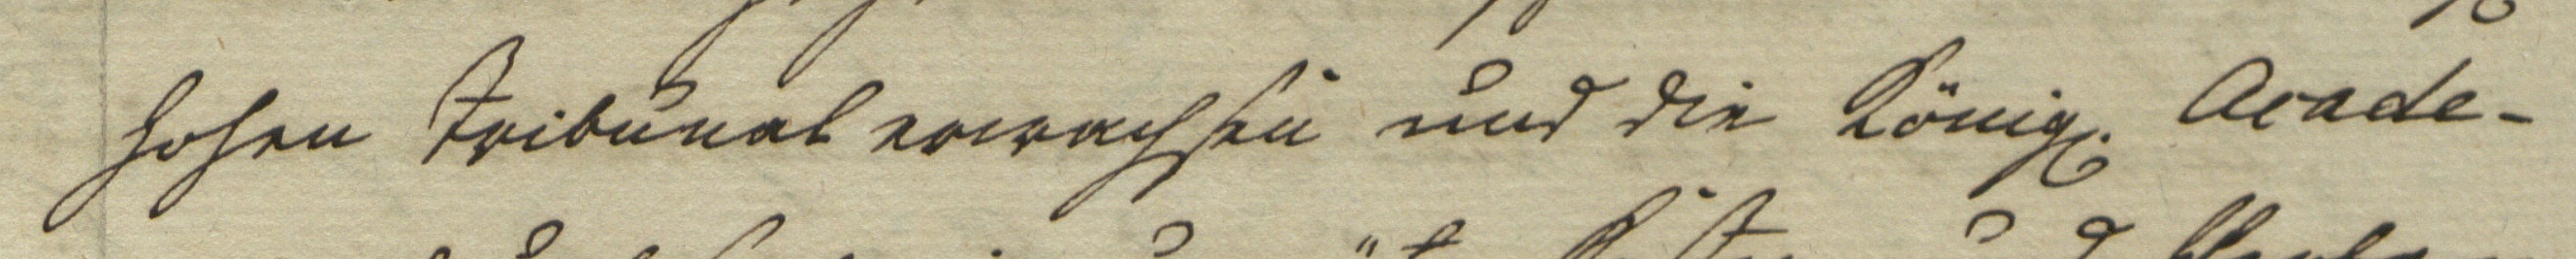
Hohen Tribunal erwachsen und die Königl. Acade¬
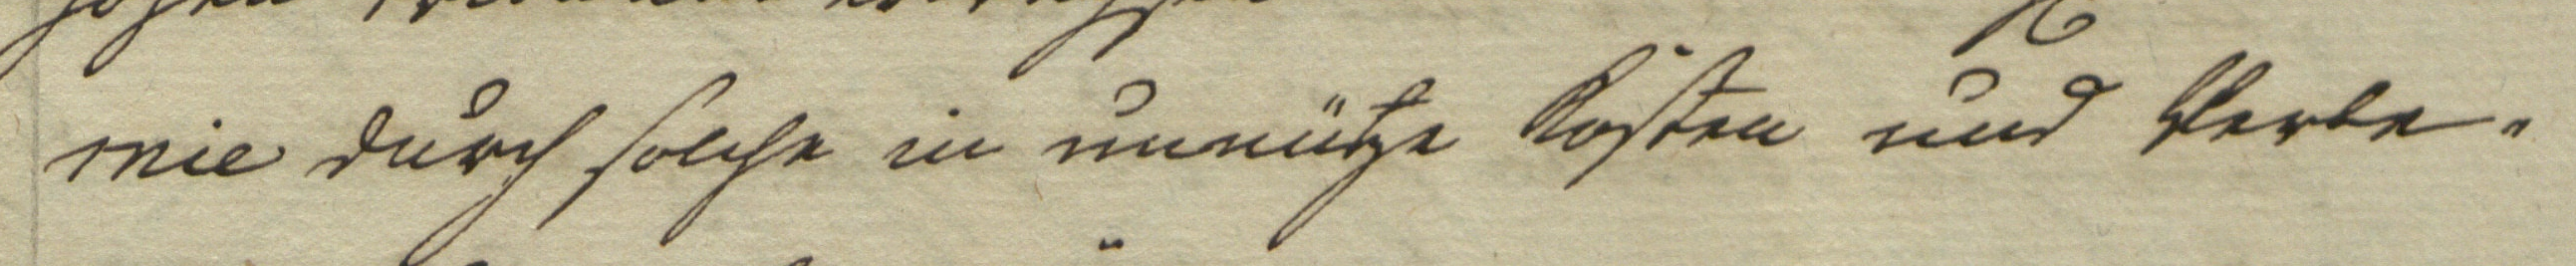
mie durch solche in unnütze Kosten und Verle¬
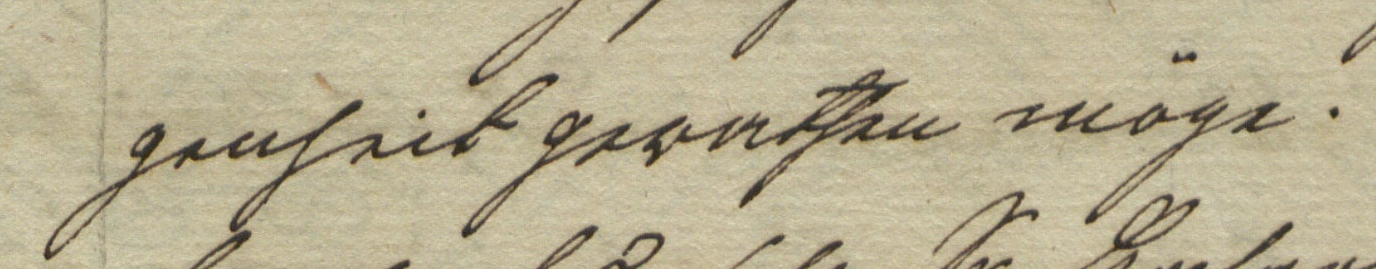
genheit gerathen möge.
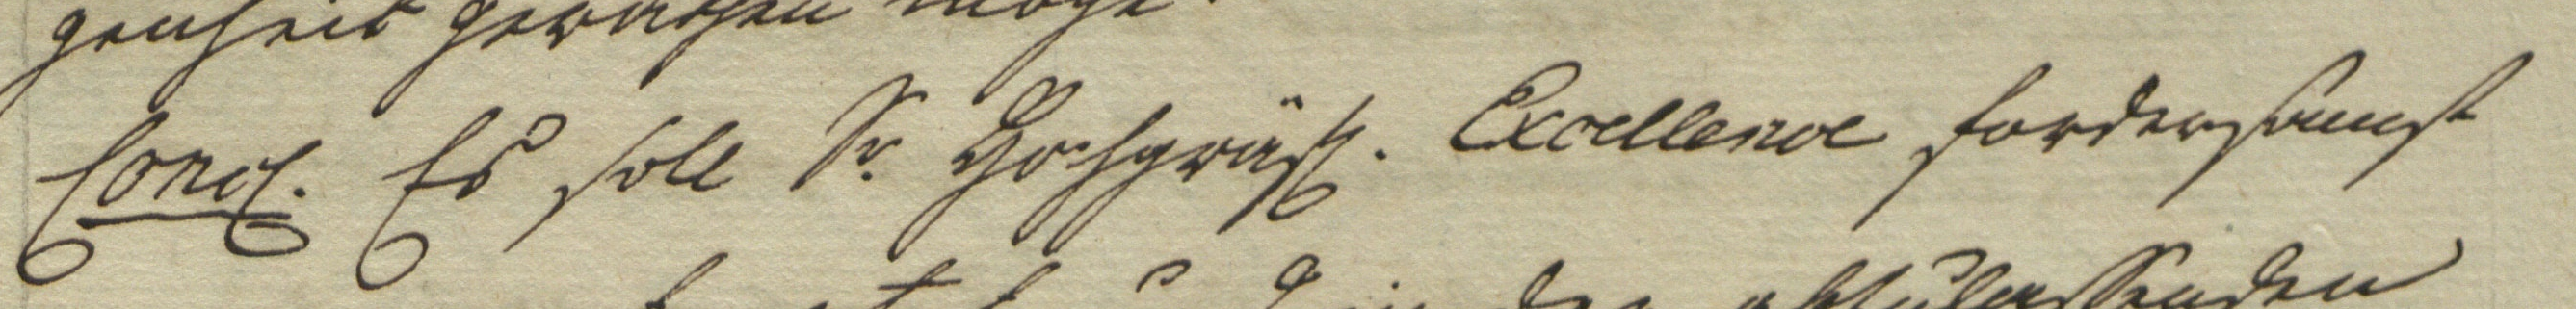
Concl. Es soll Sr Hochgräfl. Excellence fordersamst
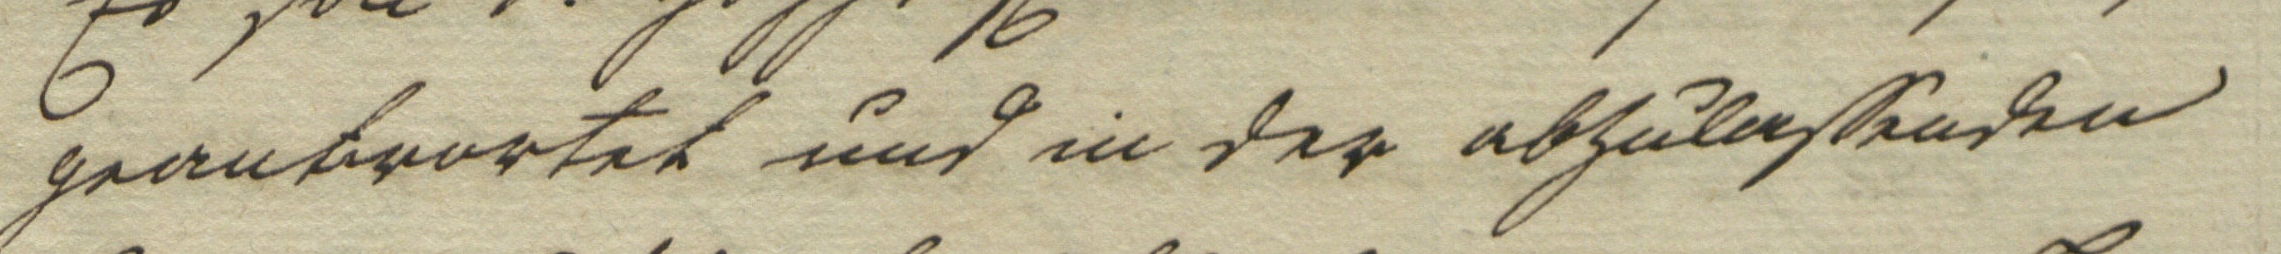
geantwortet und in der abzulassenden
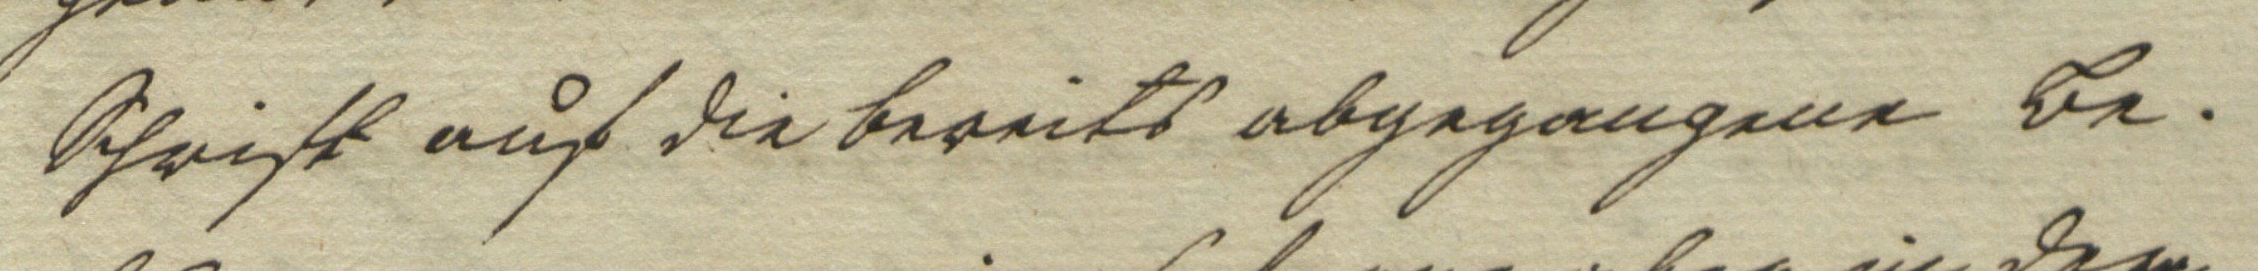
Schrift auf die bereits abgegangene Be¬
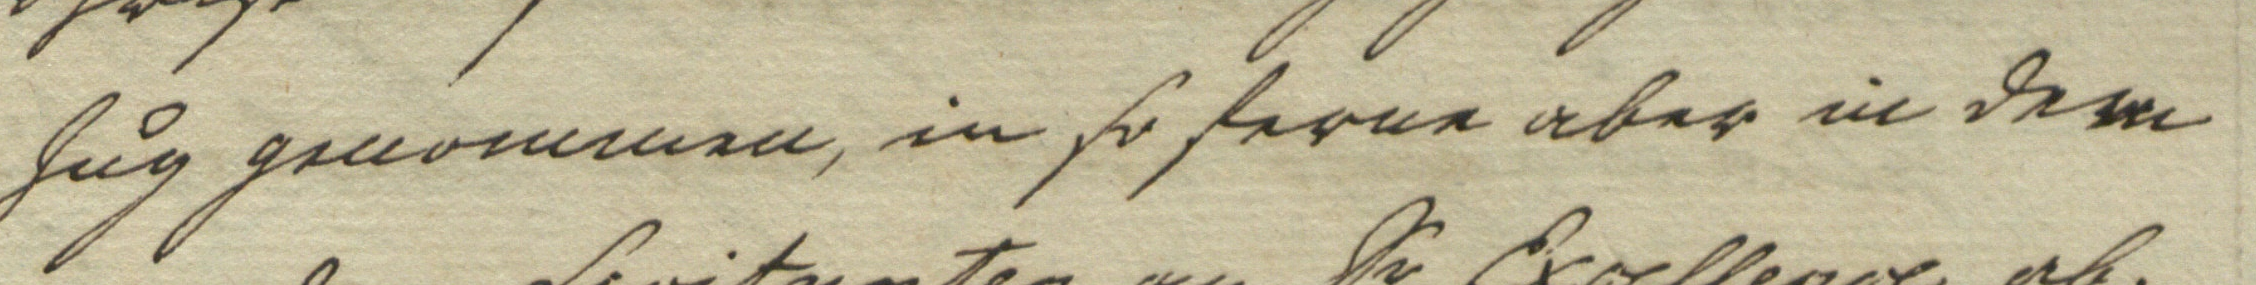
zug genommen, in so ferne aber in dem
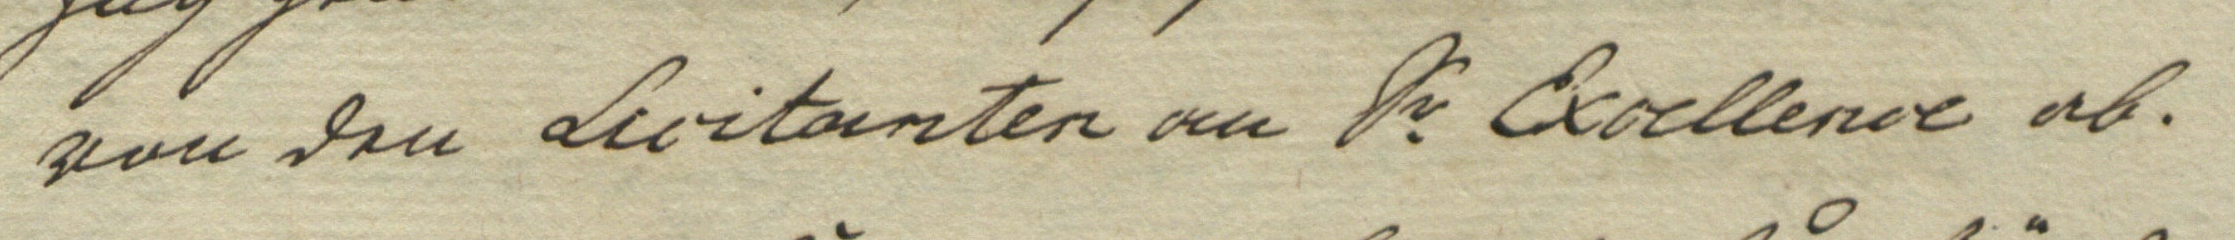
von den Licitanten an Sr Excellence ab¬
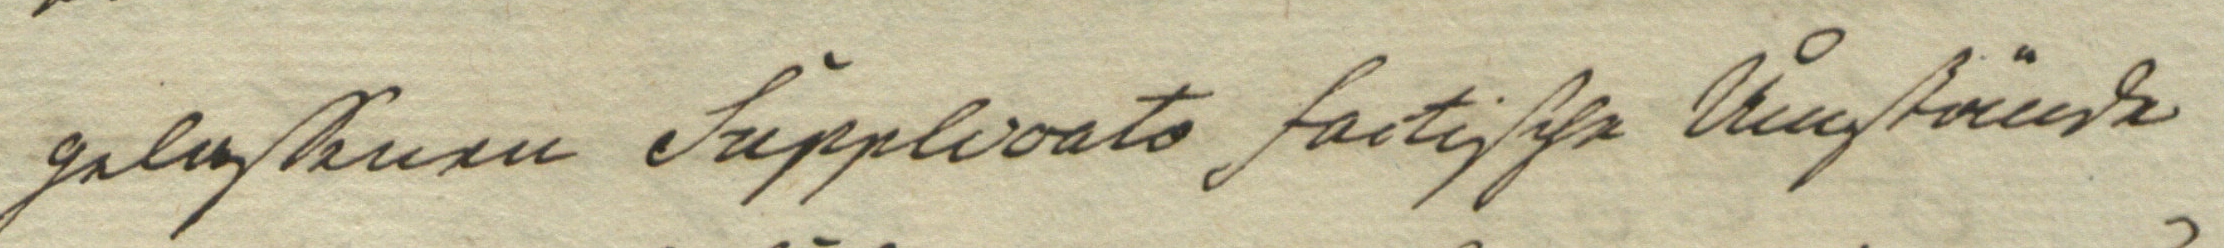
gelassenen Supplicato Factische Umstände
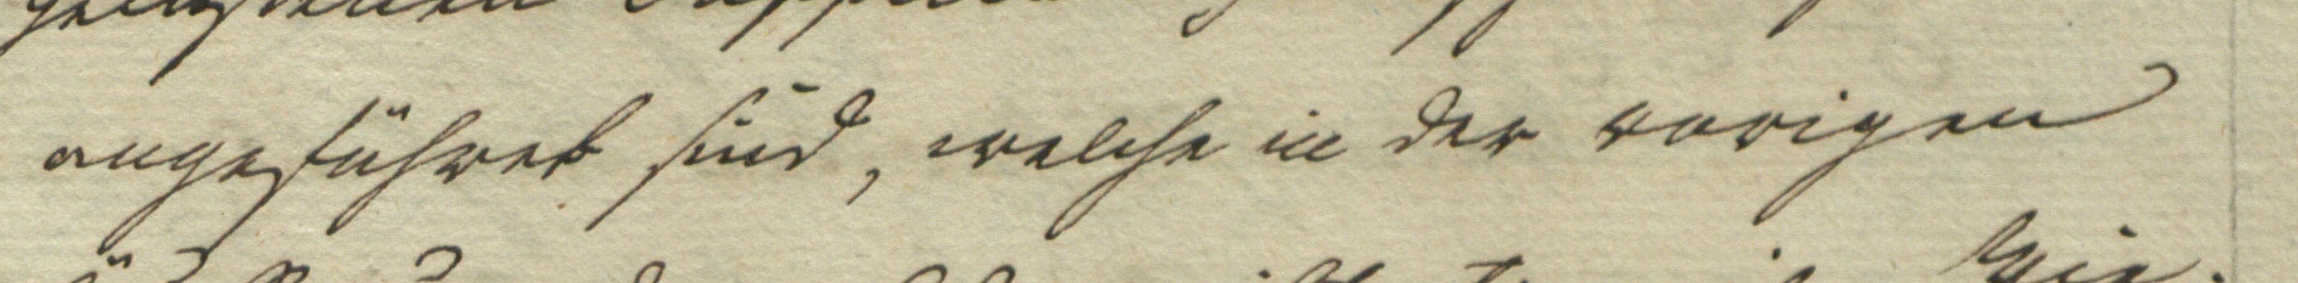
angeführet sind, welche in der vorigen
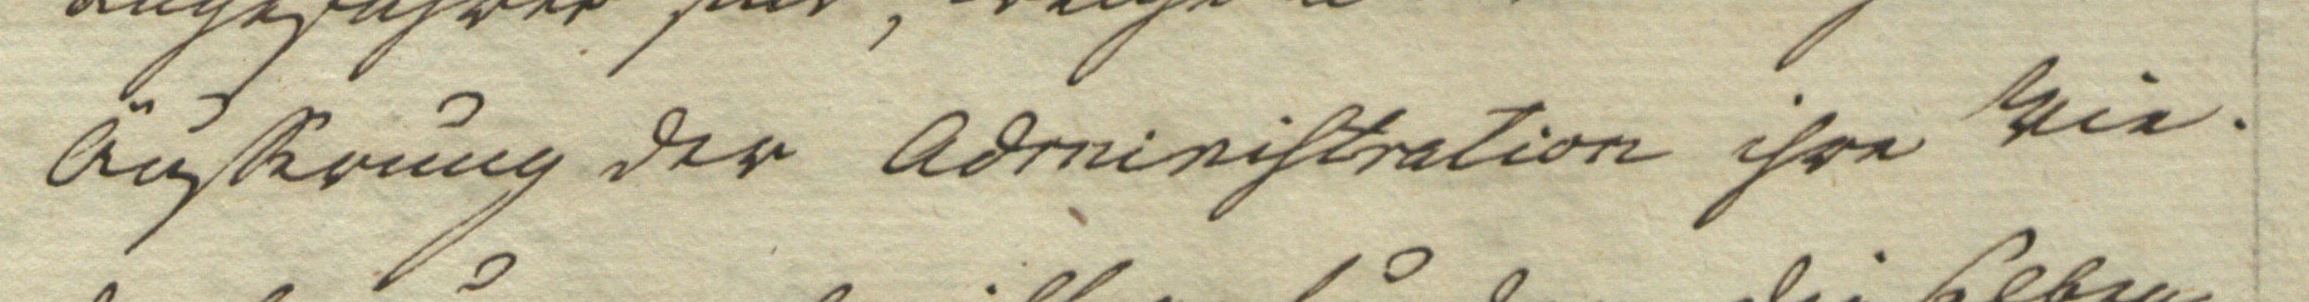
Äusserung der Administration ihre Wie¬
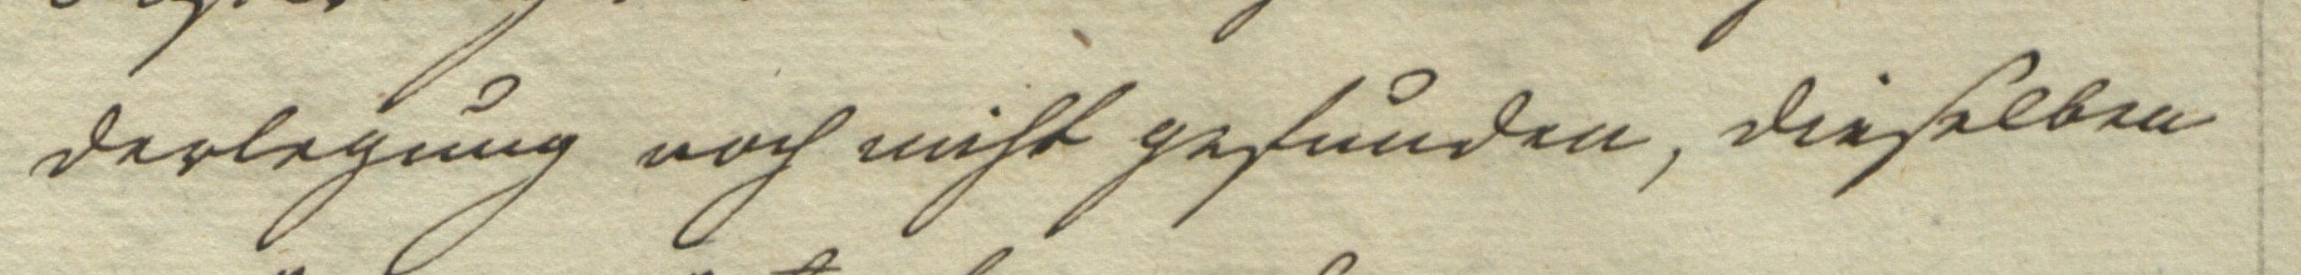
derlegung noch nicht gefunden, dieselben
